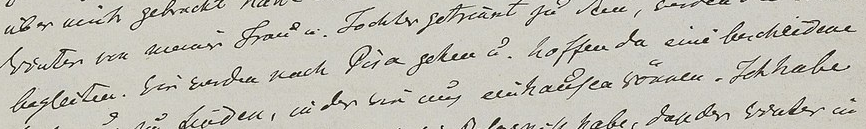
begleiten. Wir werden nach Pisa gehen u. hoffen da eine bescheidene
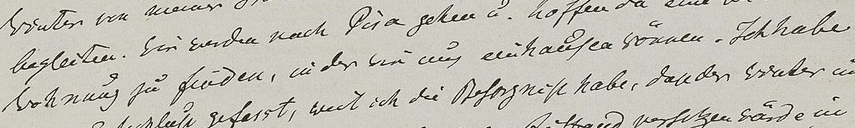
Wohnung zu finden, in der wir uns einkaufen können. Ich habe
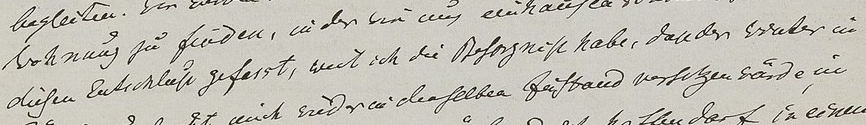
diesen Entschluss gefasst, weil ich die Besorgniss habe, dass der Winter in
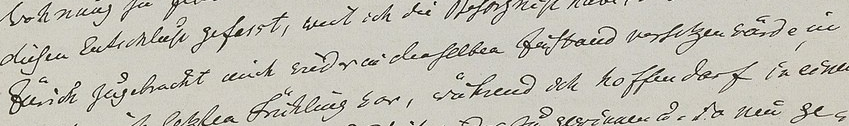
Zürich zugebracht mich wieder in denselben Zustand versetzen würde, in
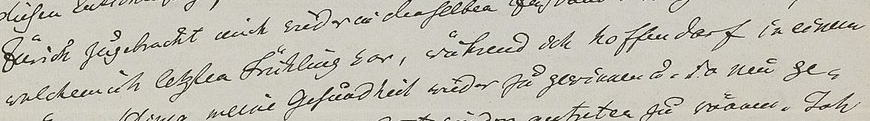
welchem ich letzten Frühling war, während ich hoffen darf in einem
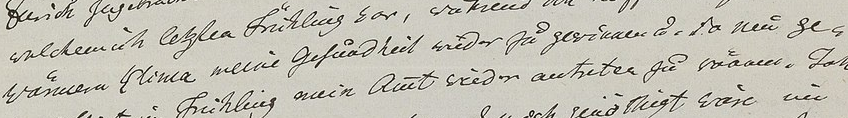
wärmern Klima meine Gesundheit wieder zu gewinnen u. so neu ge-
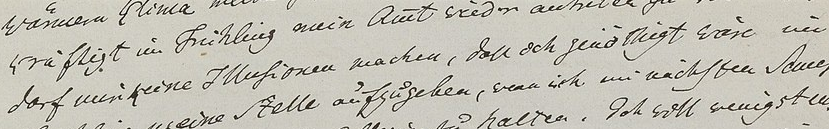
darf mir keine Illusionen machen, dass ich genöthigt wäre im
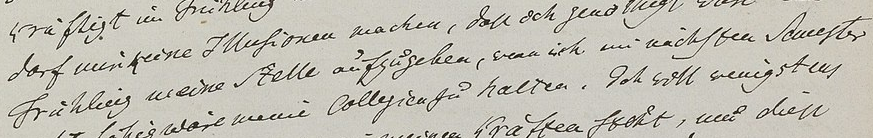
Frühling meine Stelle aufzugeben, wenn ich im nächsten Semester
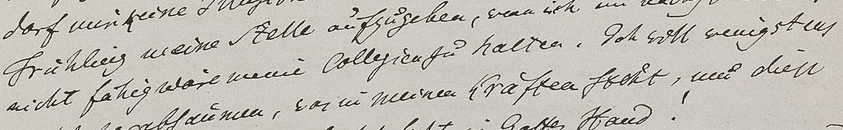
nicht fähig wäre meine Collegien zu halten. Ich will wenigstens
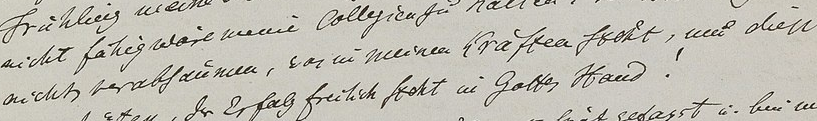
nichts verabsäumen, was in meinen Kräften steht, um diess
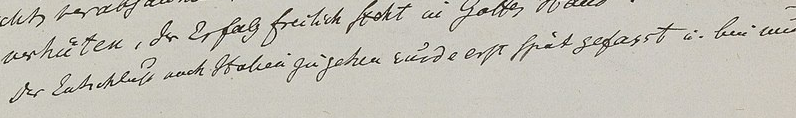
Der Entschluss nach Italien zu gehen wurde erst spät gefasst u. bin nun
